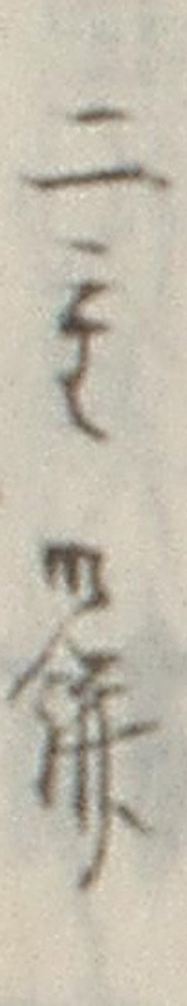二重御餅
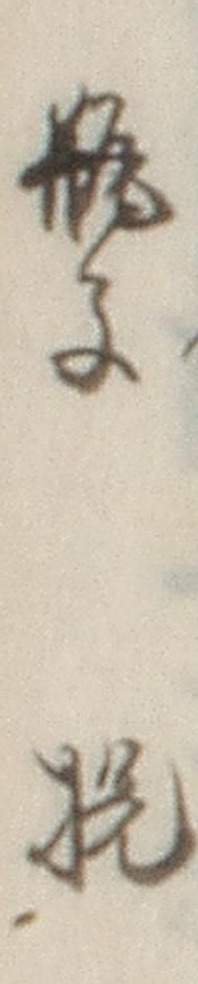瓶子提

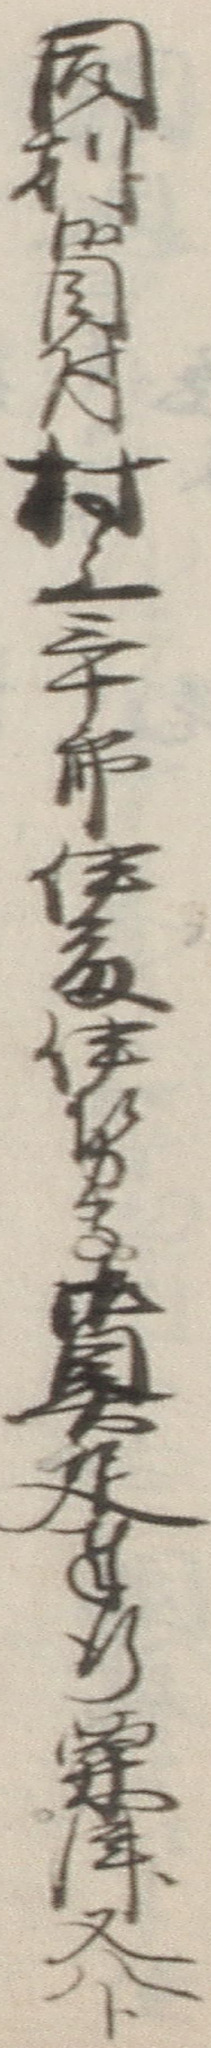同刻御目付村上三十郎伊藤伊勢守御具足奉行栗津又八ト
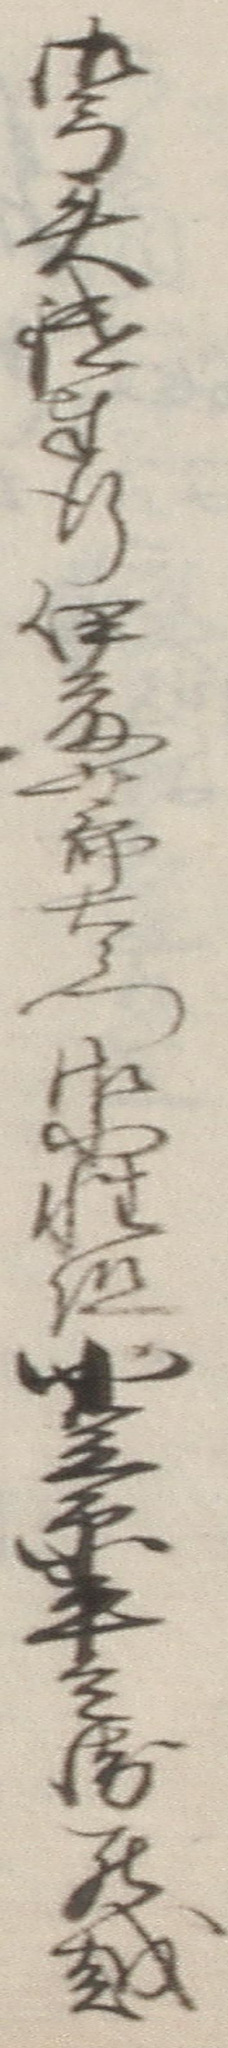御弓矢鑓奉行伊藤十郎右衛門御小姓組小笠原平兵衛罷越
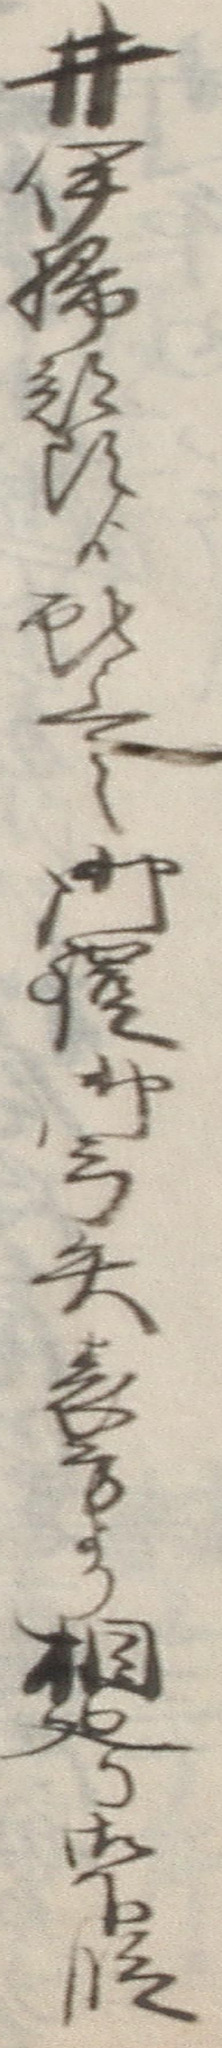井伊掃部頭ゟ献上之御鎧御弓矢表方より相廻り御下段
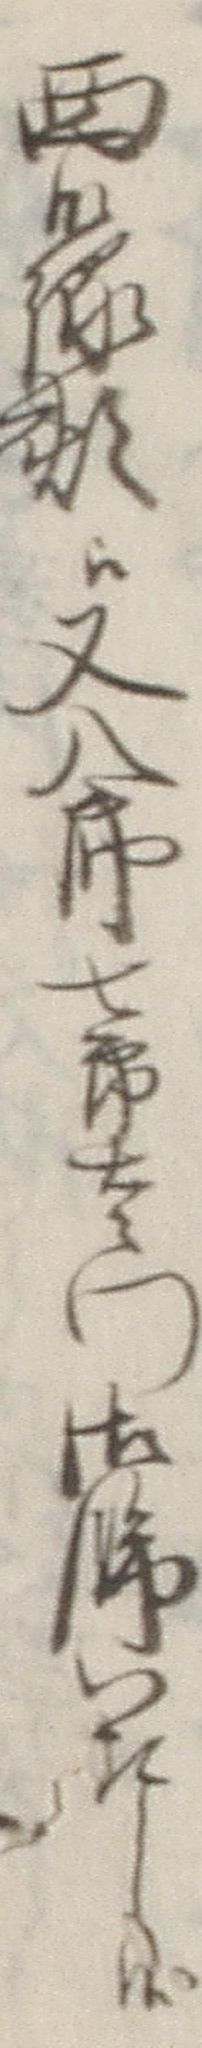西御縁頬江又八郎七郎右衛門御飾いたし候
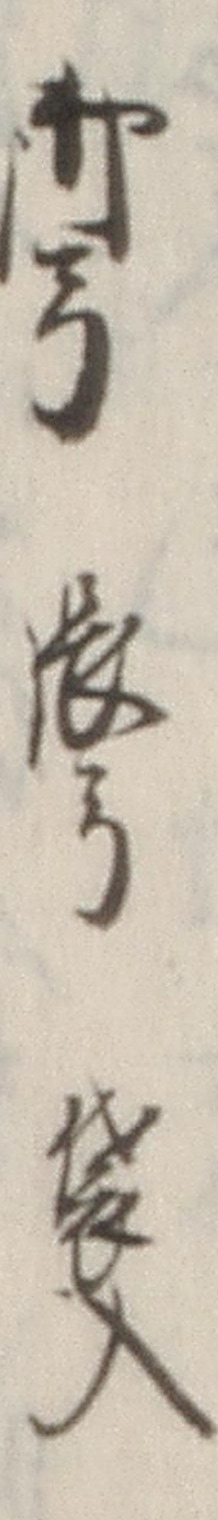御弓張弓袋入
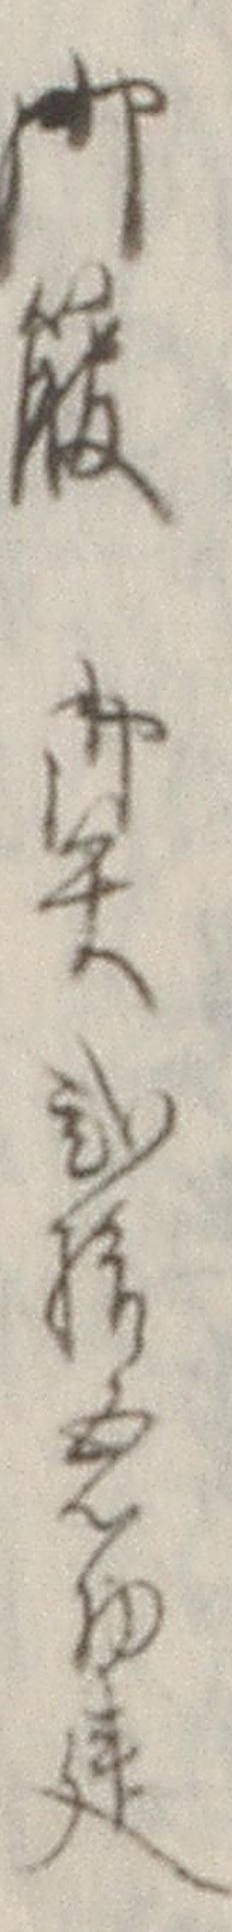御箙御矢弐拾五筋建
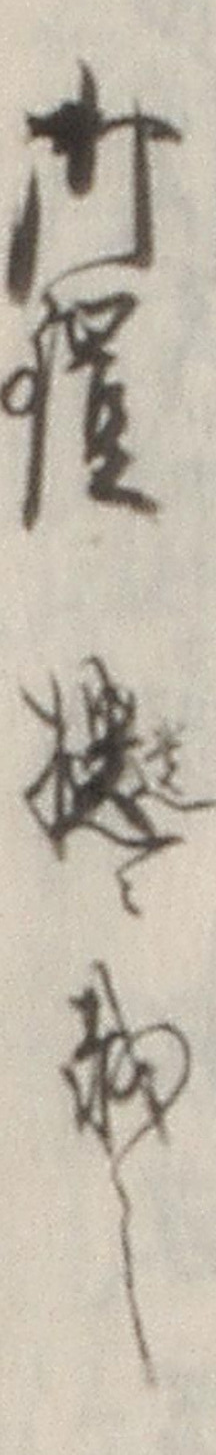御鎧櫃ニ載之
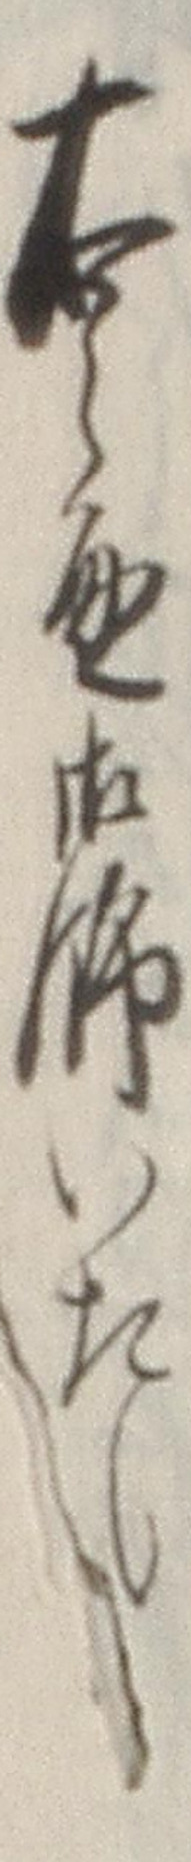右之通御飾いたし
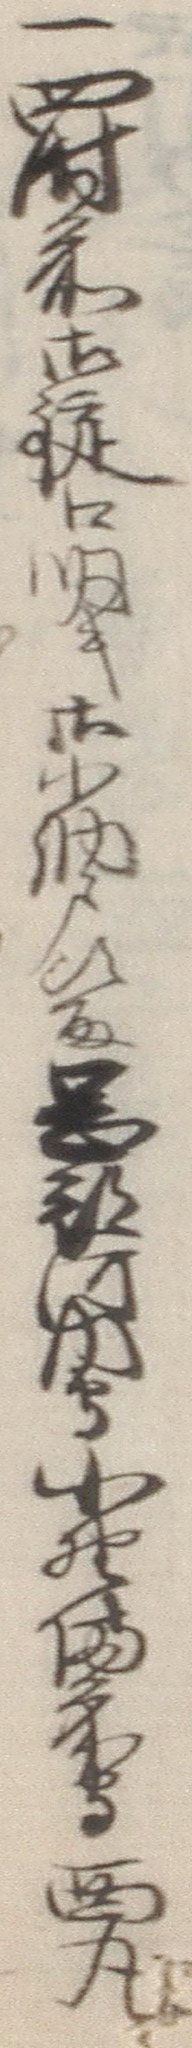一四時前御錠口明き御小納戸頭殿岡部河内守小野備前守西丸
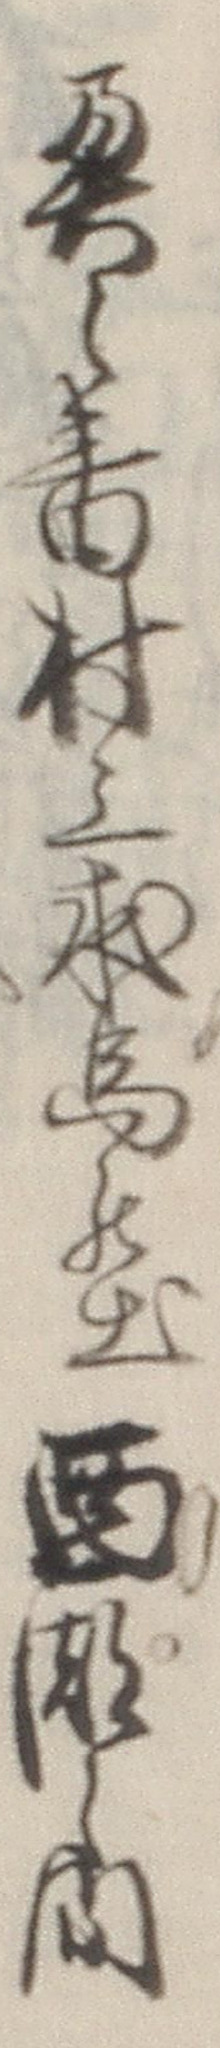奥の番村上求馬罷出西瀬之間
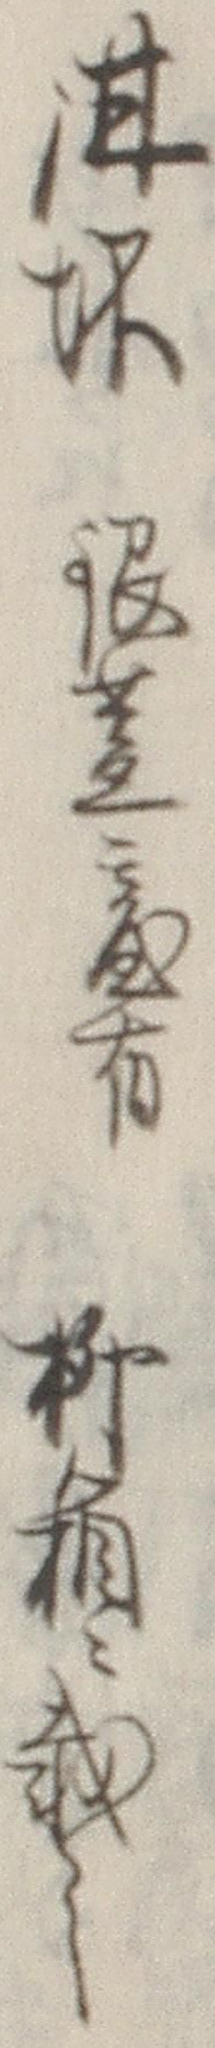泔坏銀蓋台有柳箱ニ載之
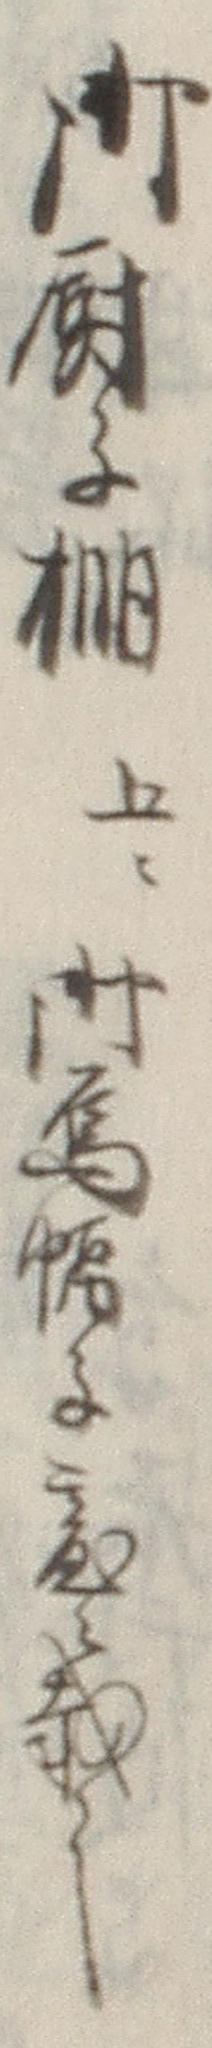御厨子棚上ニ御烏帽子台ニ載之
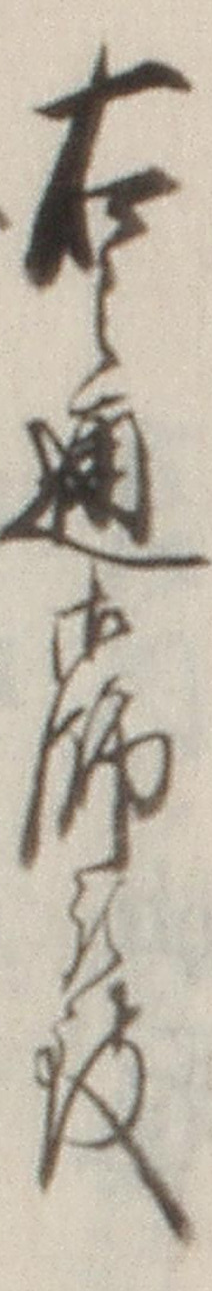右之通御飾被致
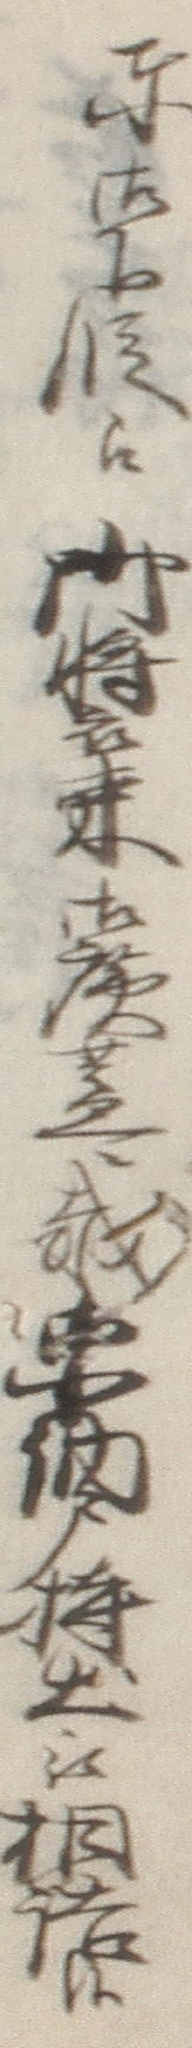東御下段え御装束御広蓋ニ載東納戸持出被相詰候
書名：[諸国災害記録]
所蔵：東京大学地震研究所図書室 Earthquake Research Institute Library, The University of Tokyo, JAPAN
